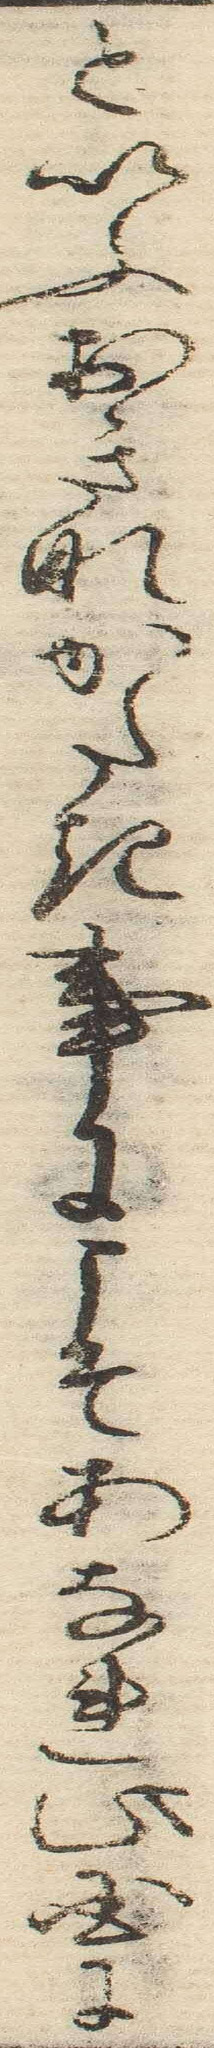といふおきなかたき事にこそあなれ此国に
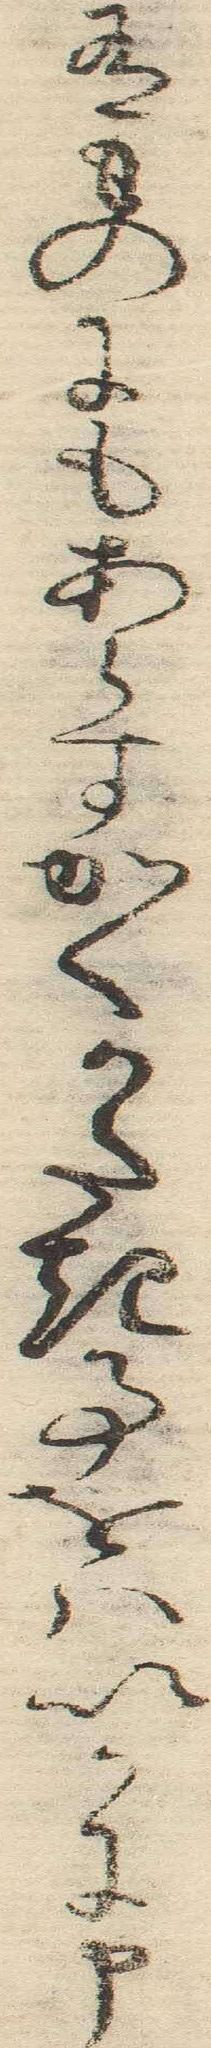有ものにもあらすかくかたき事をはいかに申
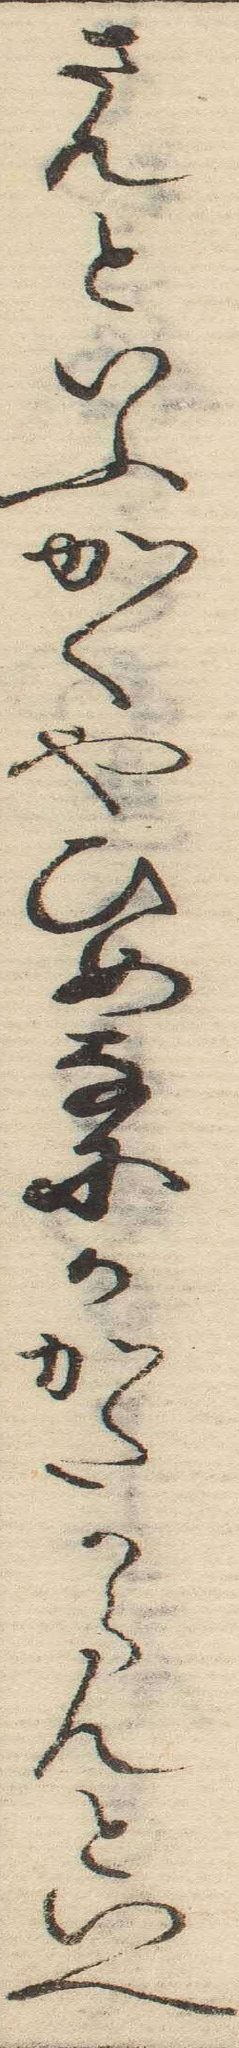さんといふかくやひめなにかたからんといへ

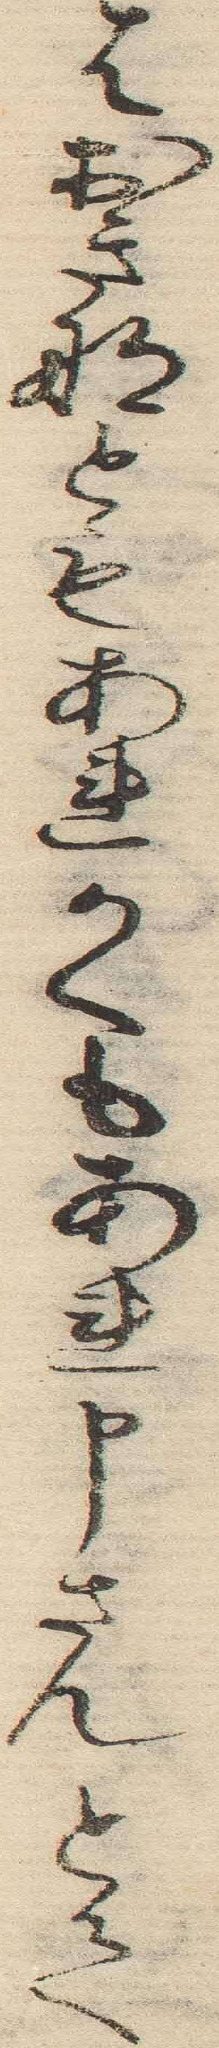はおきなともあれかくもあれ申さんとて
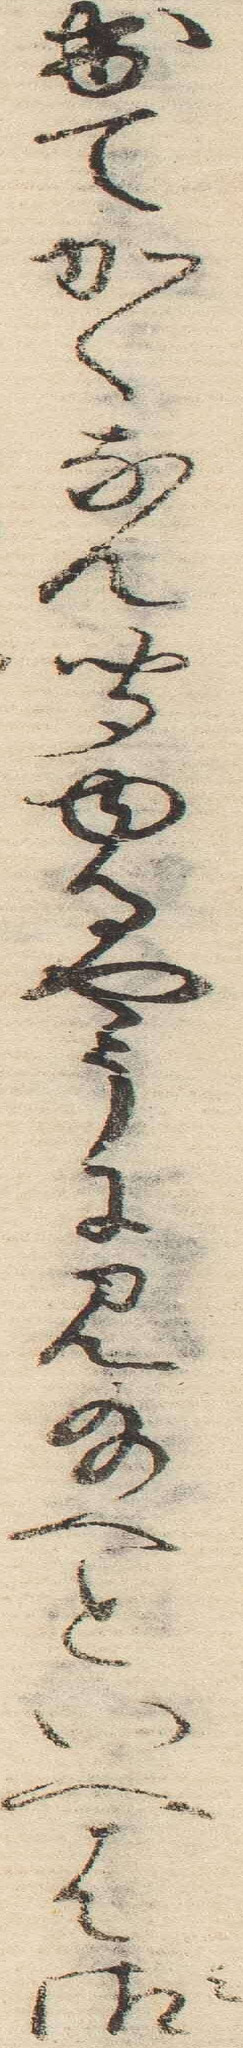出てかくなん聞ゆるやうに見給へといへは御
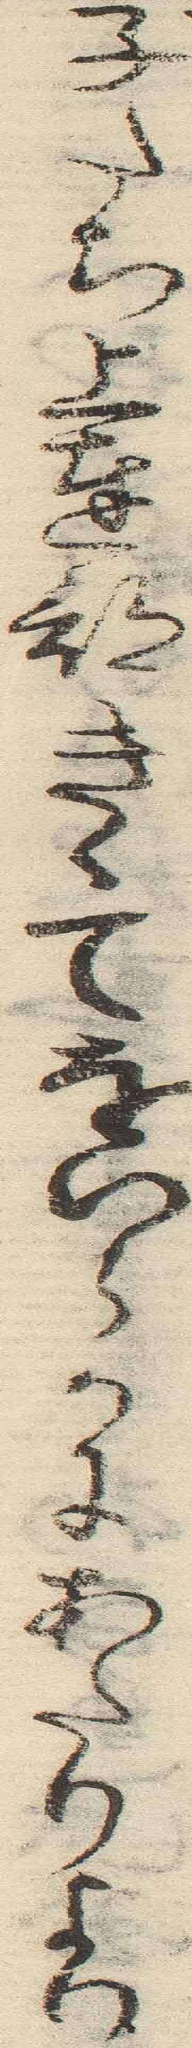子たち上達部きゝてをいらかにあたりより
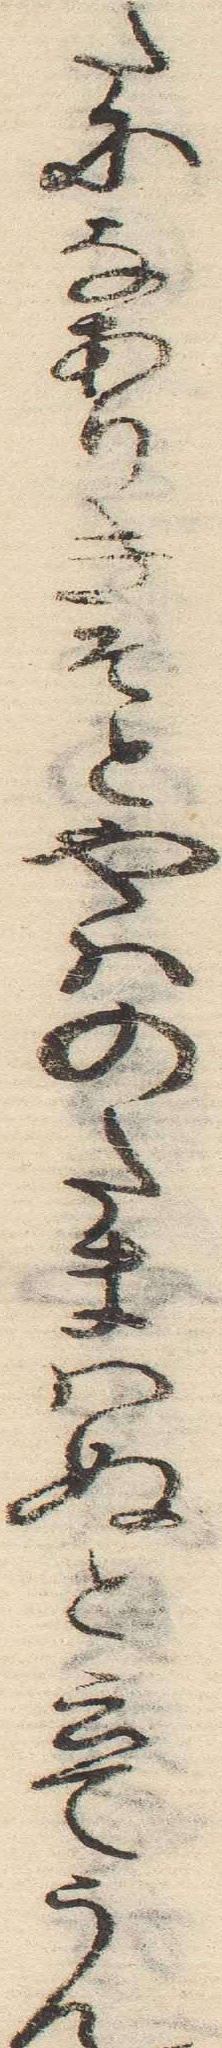たになありきそとやはのたはぬと云てうん
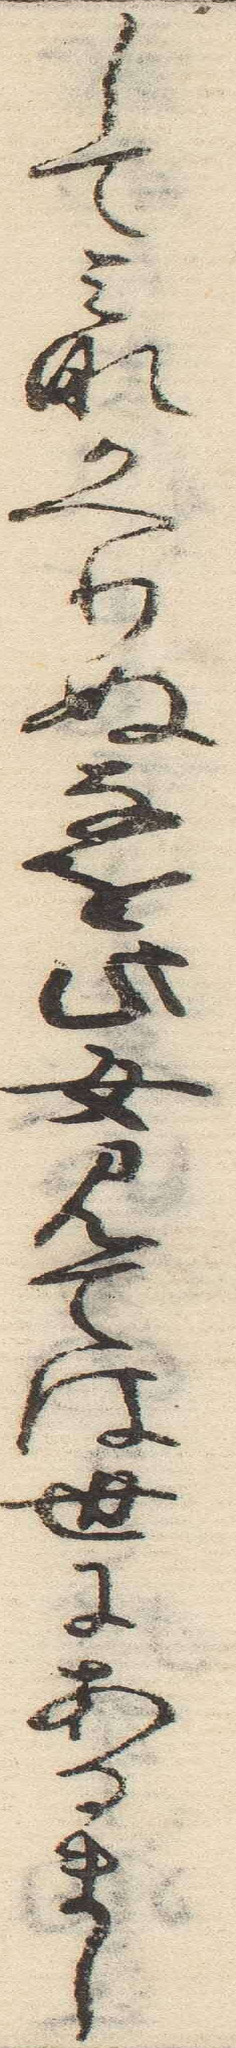してみなかへりぬなを此女見ては世にあるまし
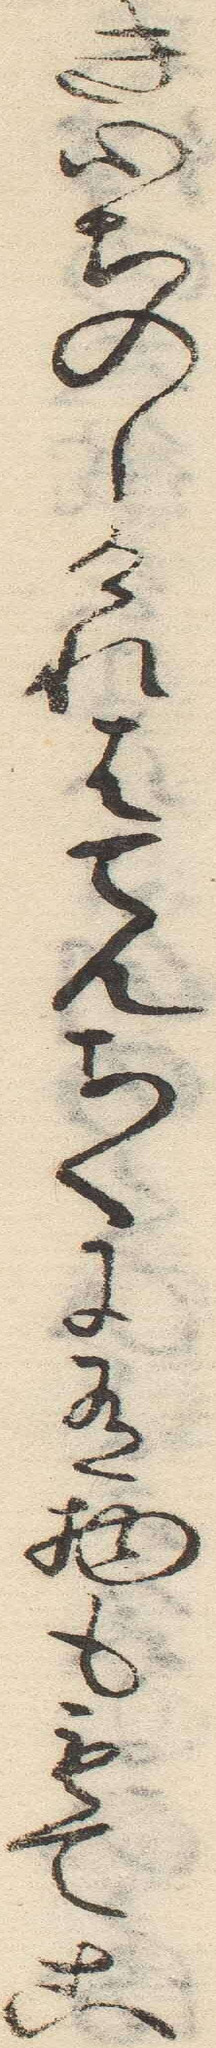き心ちのしけれはてんちくに有物ももてこ
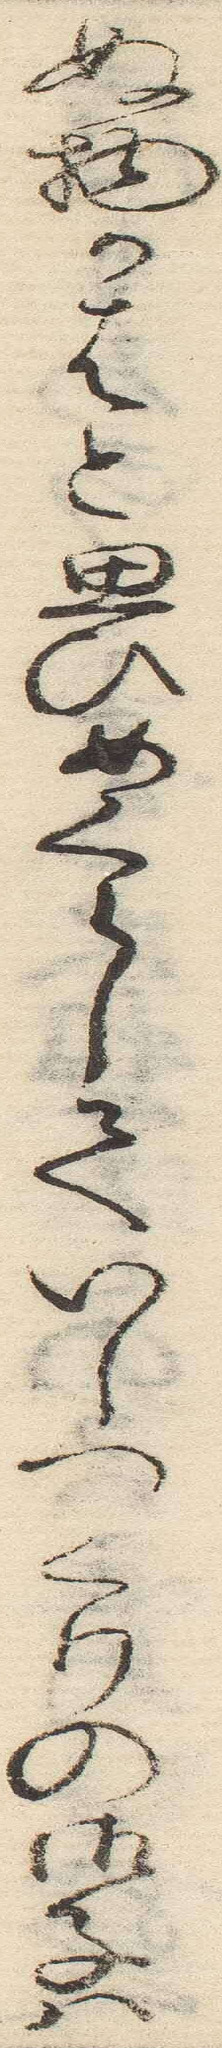ぬ物かはと思ひめくらしていしつくりの御子は
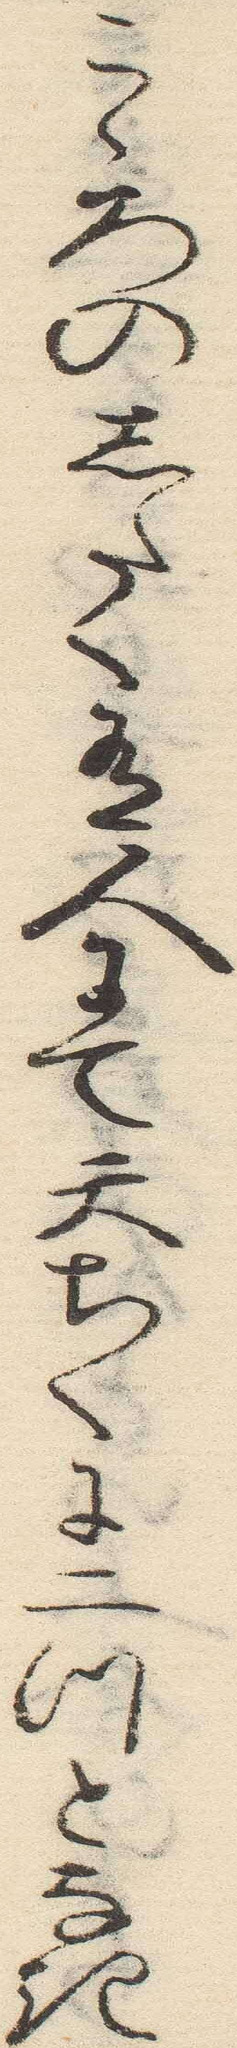こゝろのしたく有人にて天ちくに二つとなき
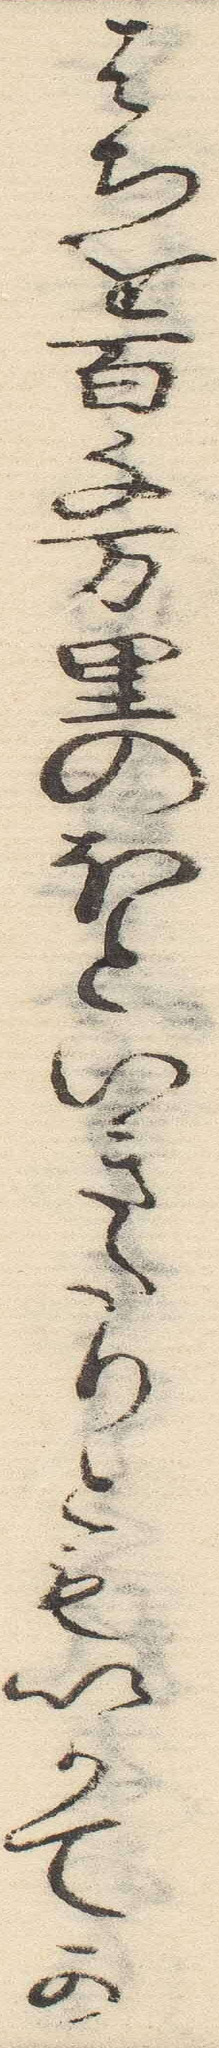はちを百千万里のほといきたりともいかてか
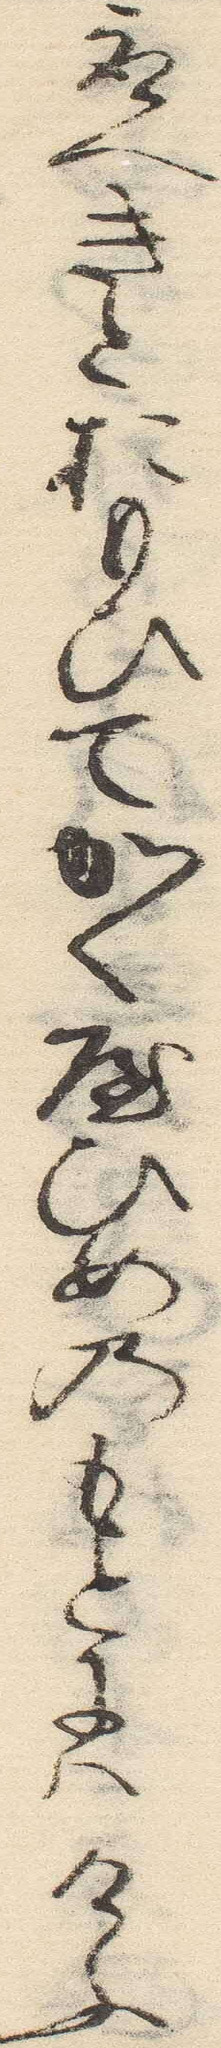取へきとおもひてかくやひめのもとにはけふ
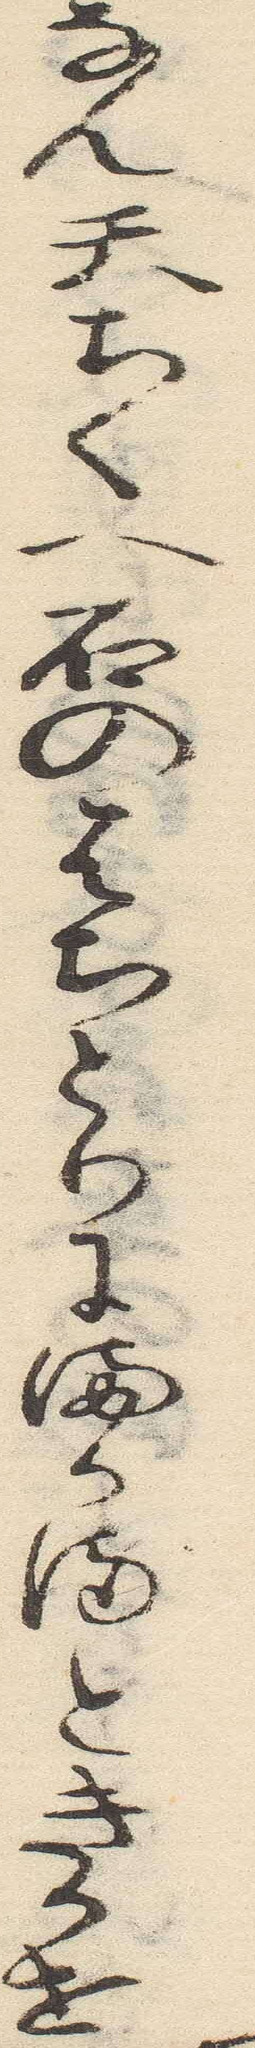なん天ちくへ石のはちとりにまかるときかせ
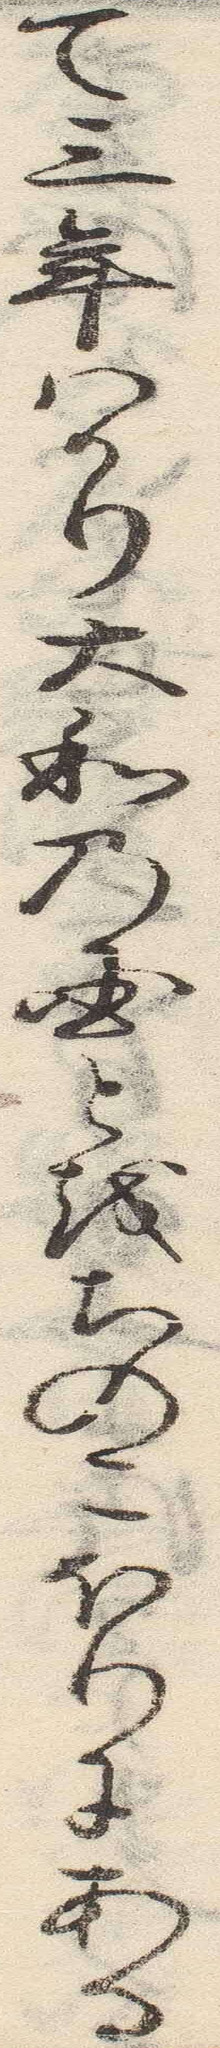て三年はかり大和の国とをちのこほりにある
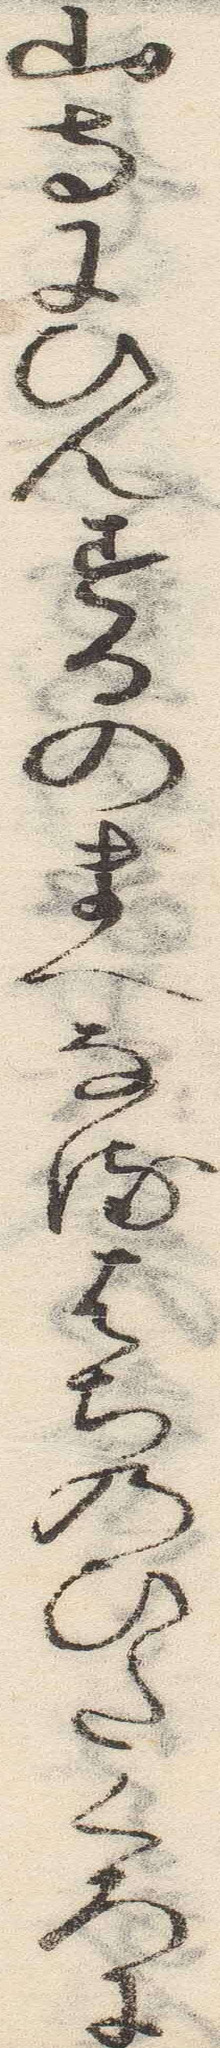山寺にひんするのまへなるはちのひたくろに
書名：竹取物語
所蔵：東京学芸大学附属図書館 国文学研究資料館
